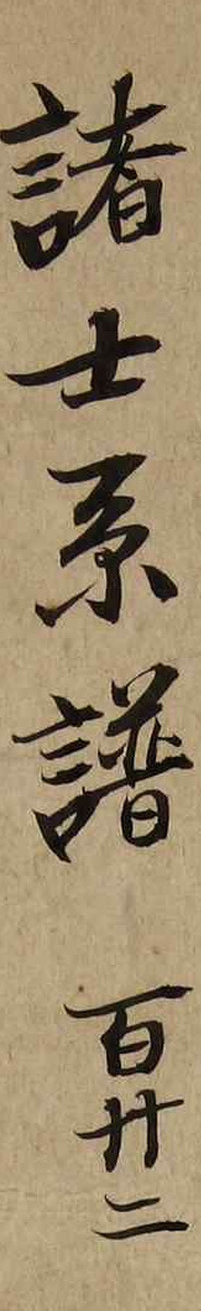諸士系譜百廿二

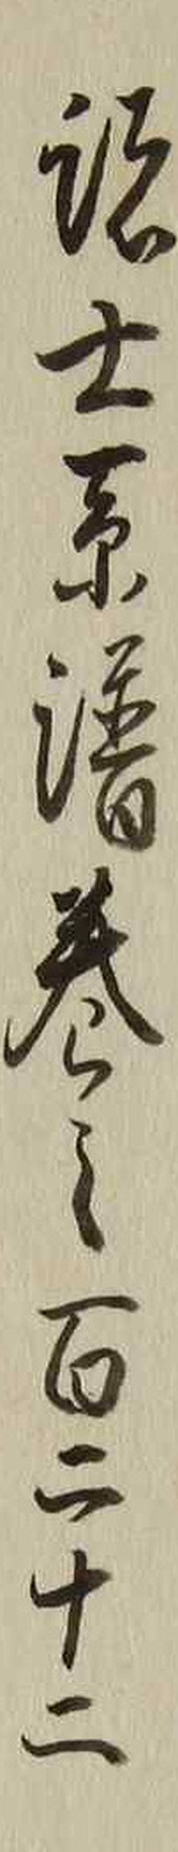諸士系譜巻之百二十二
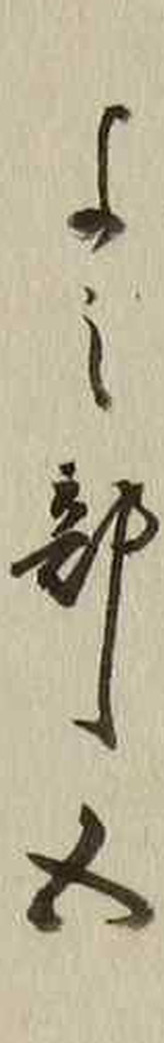よ之部五
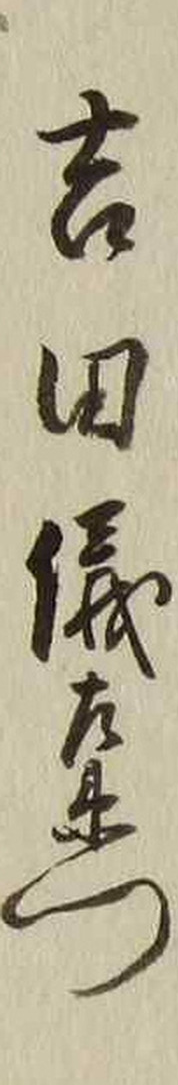吉田儀左衛門

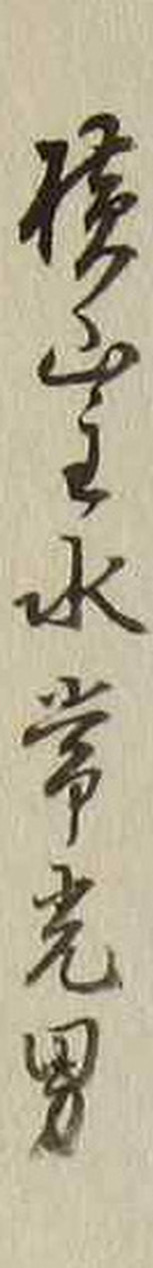横山主水常光男
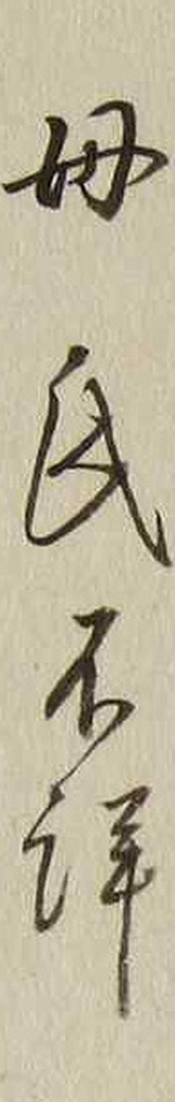母氏不詳
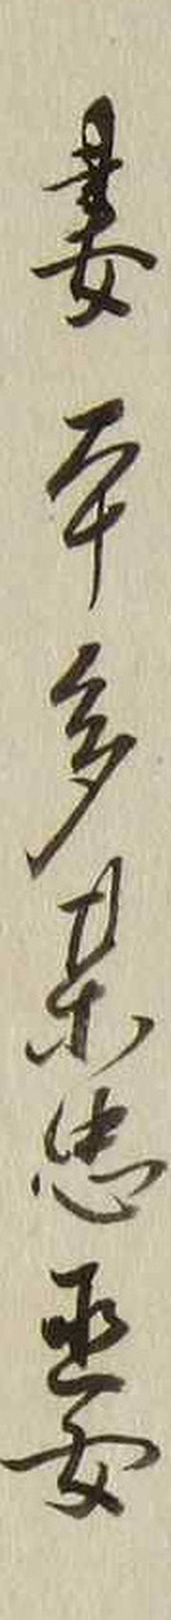妻本多某忠直女
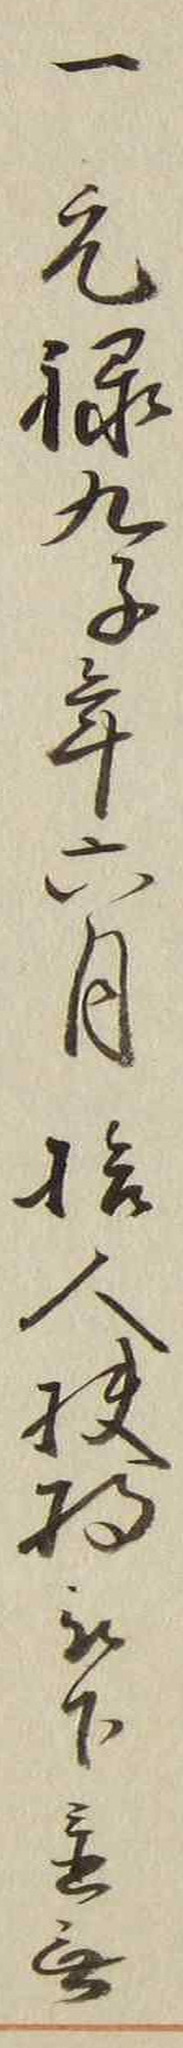一元禄九子年六月拾人扶持被下置無

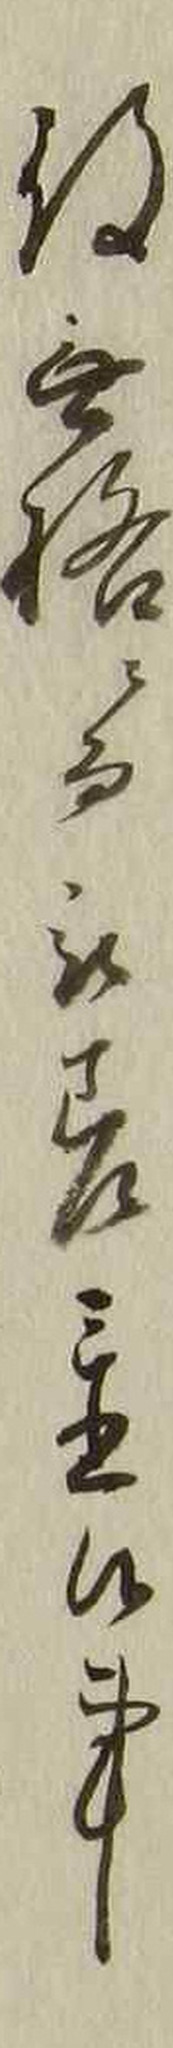役無格ニ而被差置候事
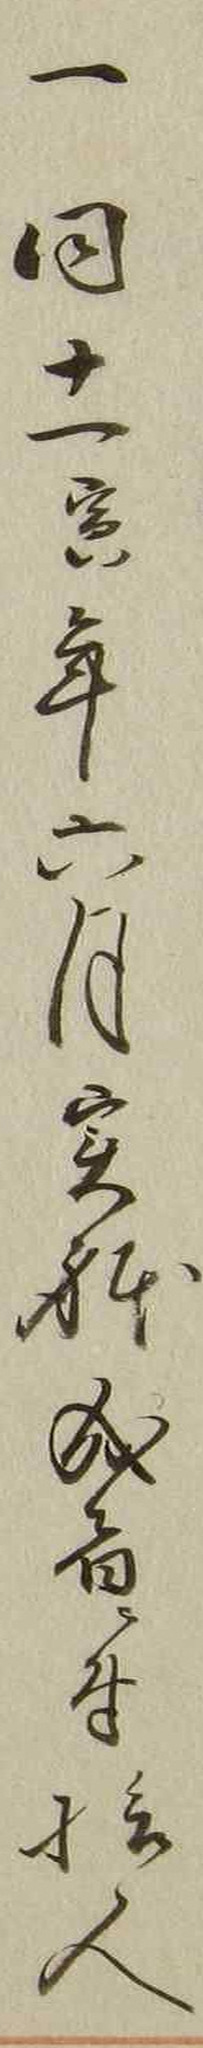一同十一寅年六月実体成者ニ付拾人
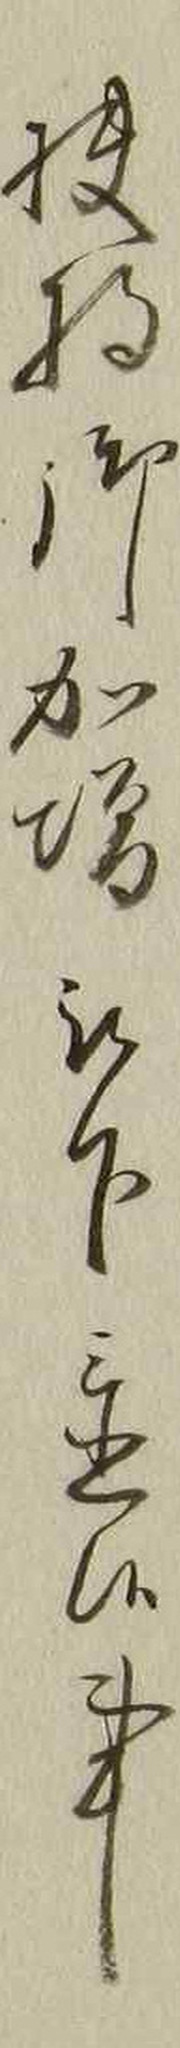扶持御加増被下置候事
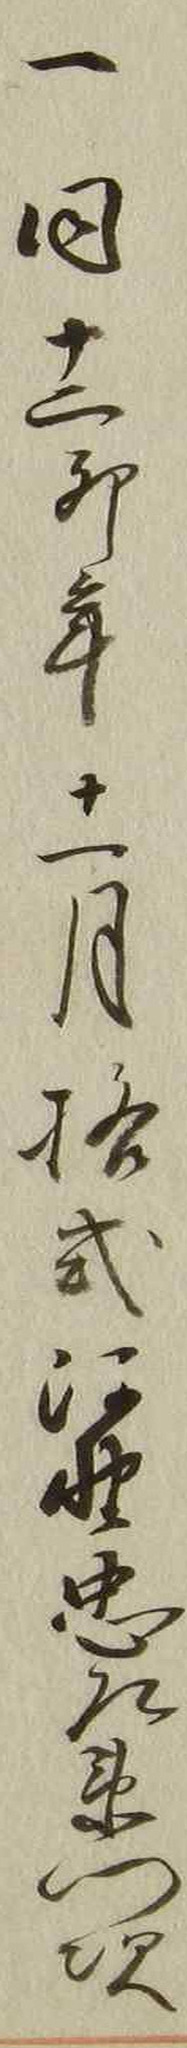一同十二卯年十一月格式河野忠左衛門次
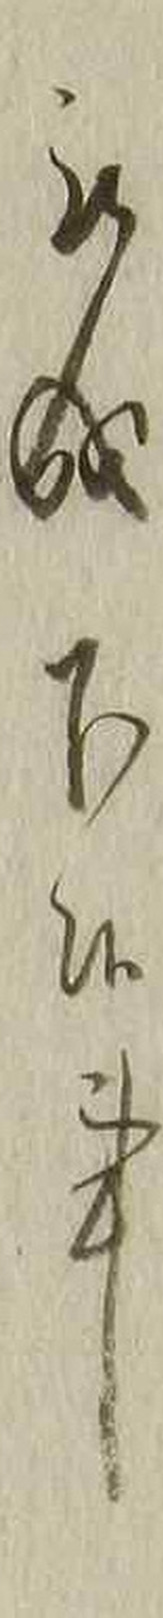被成下候事
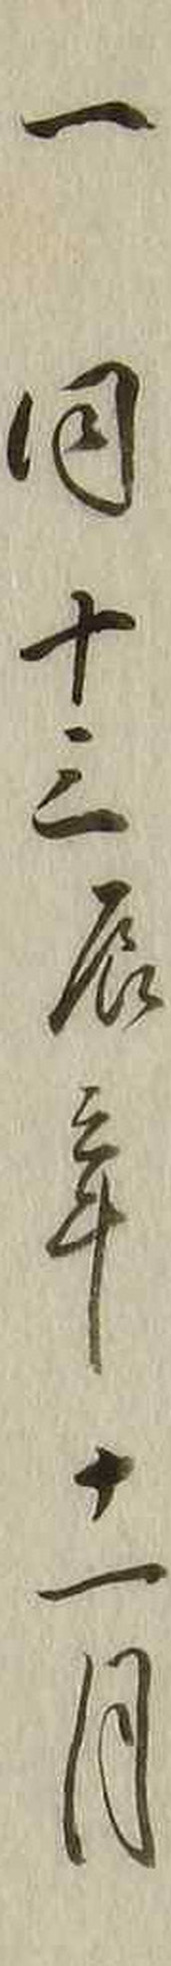一同十三辰年十一月
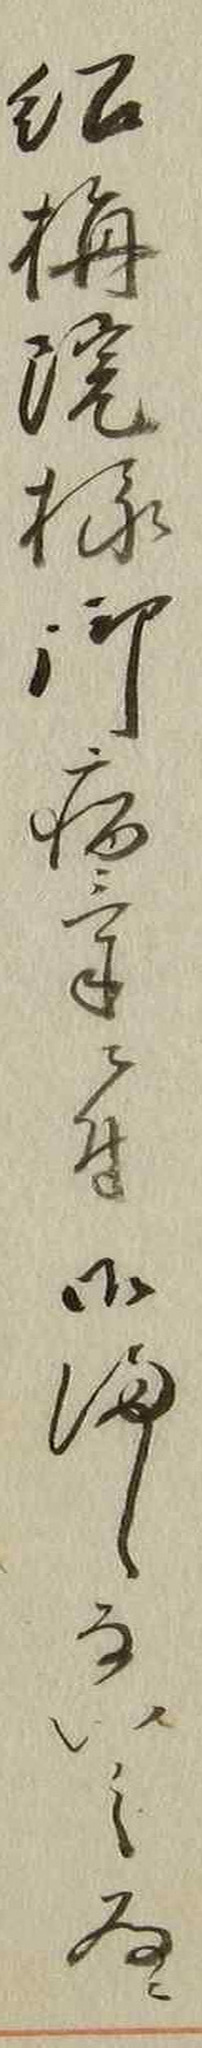紹栴院様御病気ニ付御ましない之為ニ
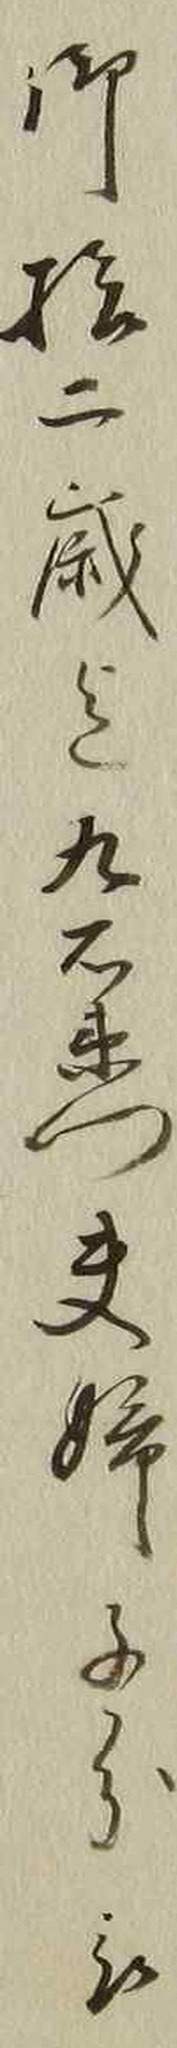御拾二歳迄九右衛門夫婦子分被
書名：諸士系譜　巻之122　よ之部5
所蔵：会津若松市立会津図書館
